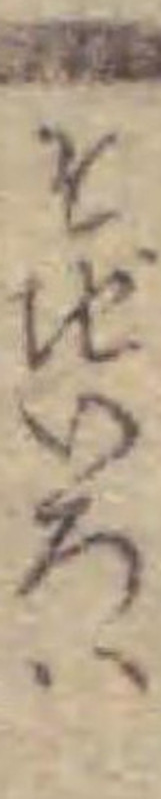そ地いろは
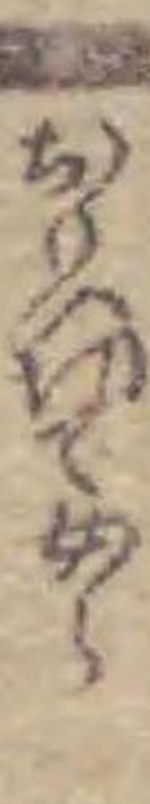おもひ切て女郎
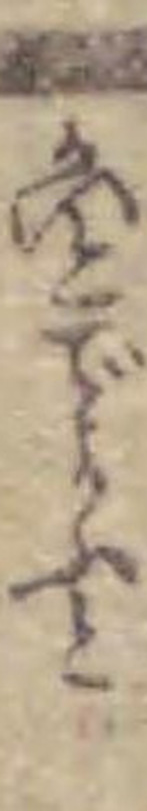かいとでよふと
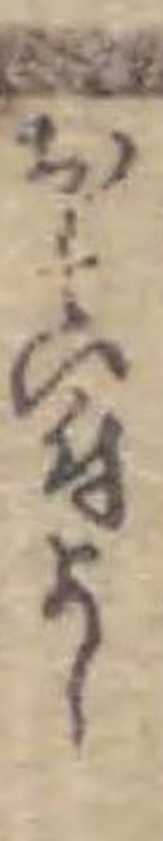おもい付よし
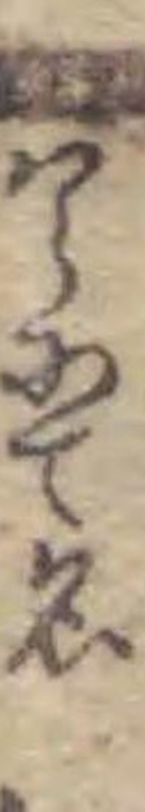はらにて名
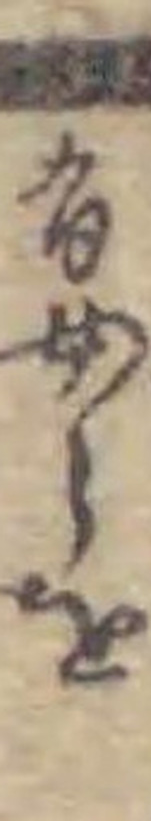有女郎を
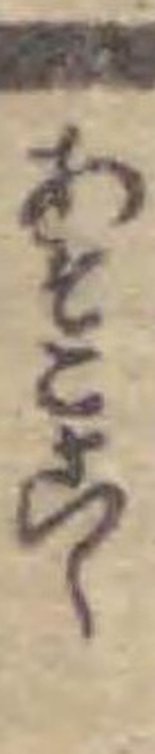あそここゝ
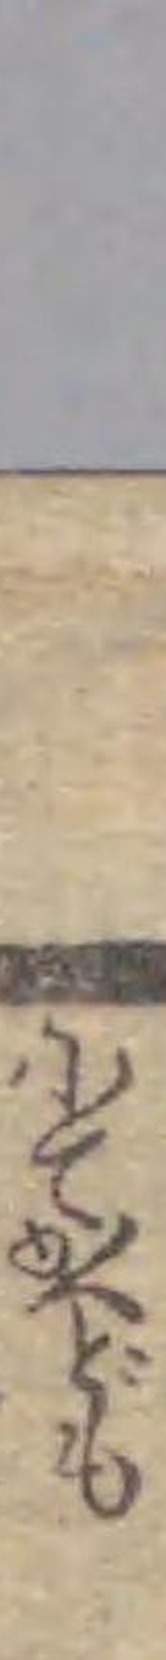にてかへども
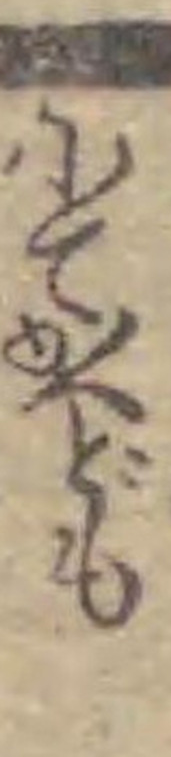にてかへども
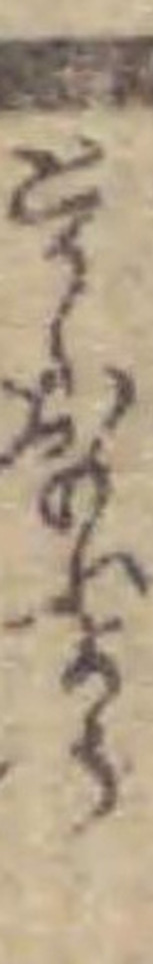とかくおもふよう
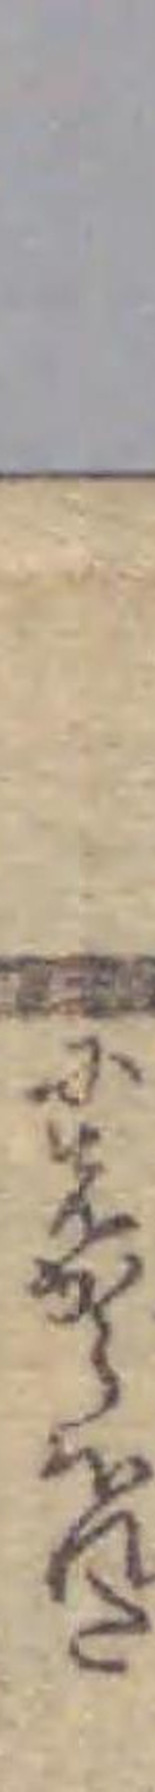に先からほれた
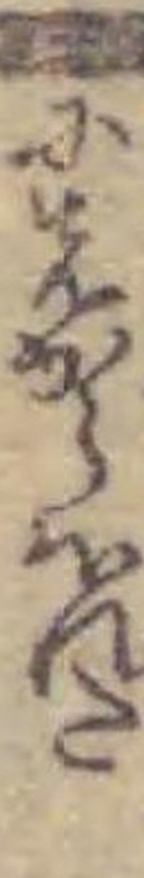に先からほれた
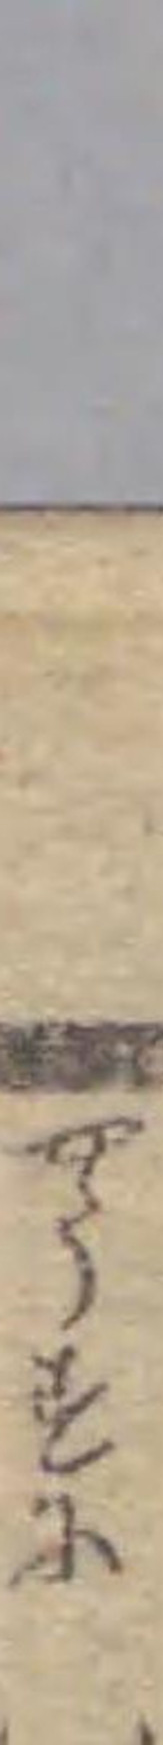やうすに
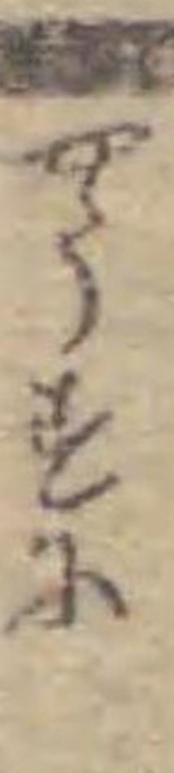やうすに
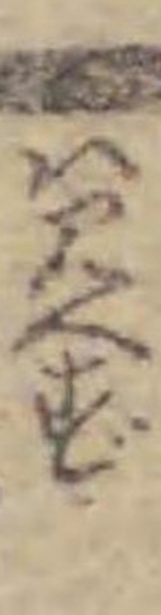は見へず
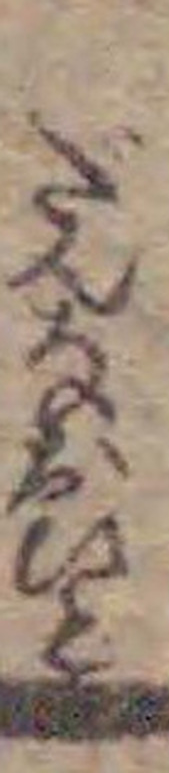だんなおひと
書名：通風伊勢物語 : 3巻
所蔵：国立国会図書館 National Diet Library, JAPAN
